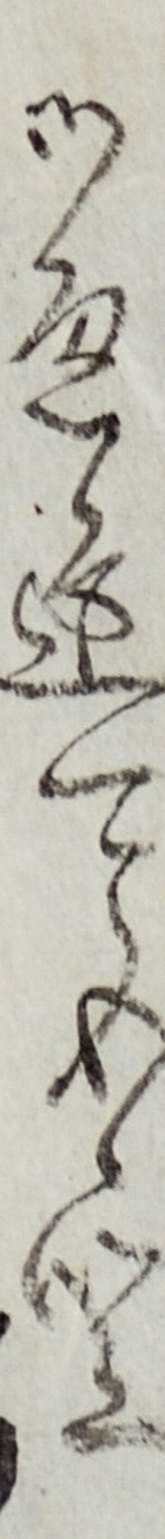御通達可被成候以上
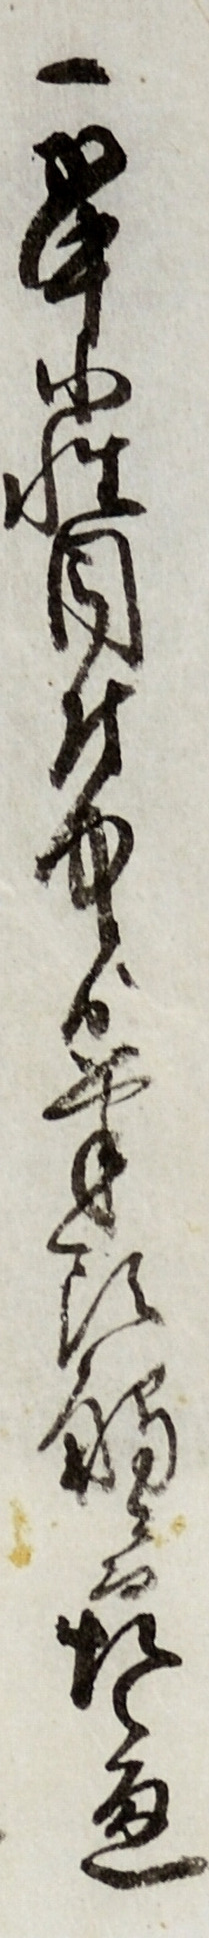一御中小性目付中ゟ筆頭触ニ而左之通
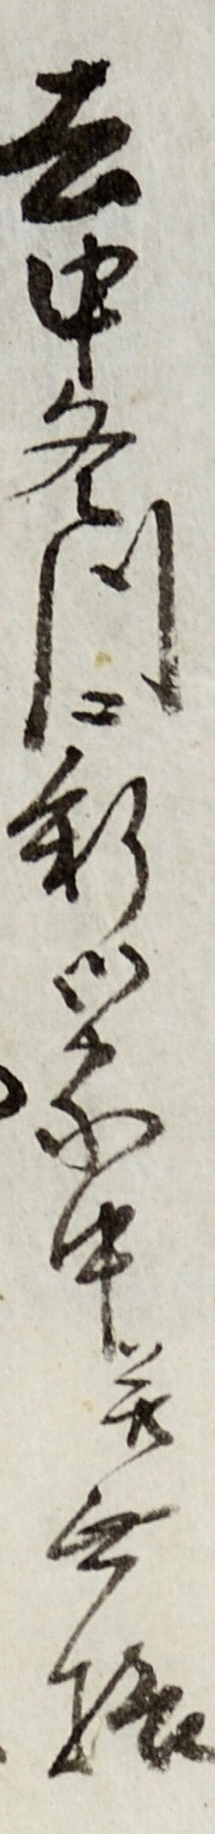去申冬川薪御家中并無格
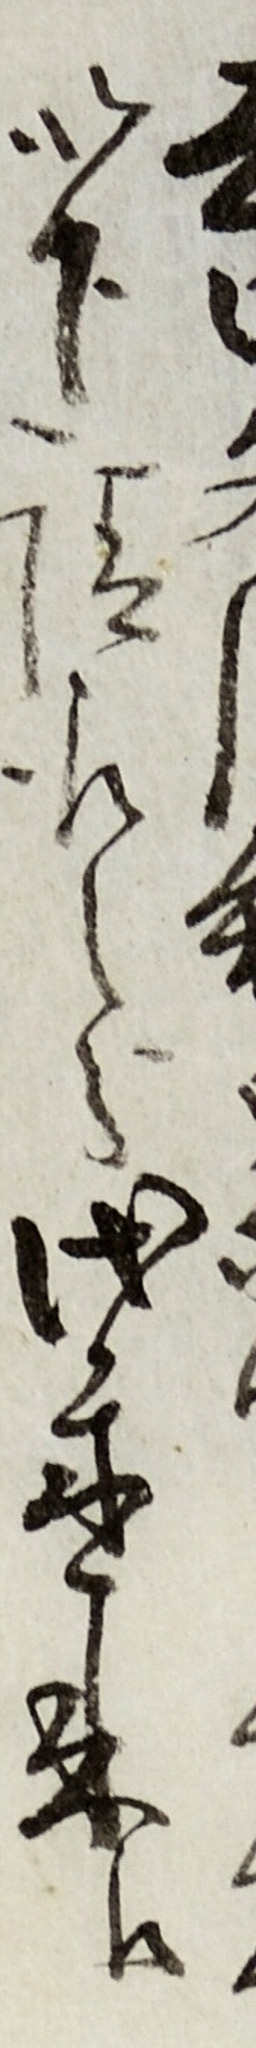以下請取之分代金来ル
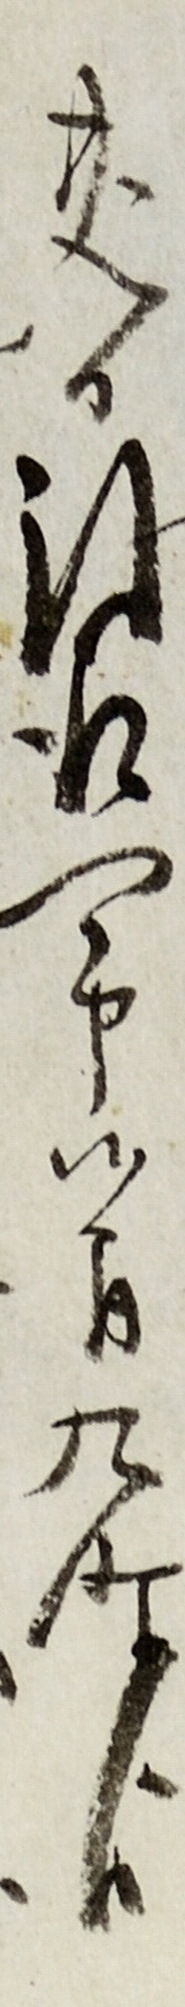廿八日引取可申候間九時ゟ
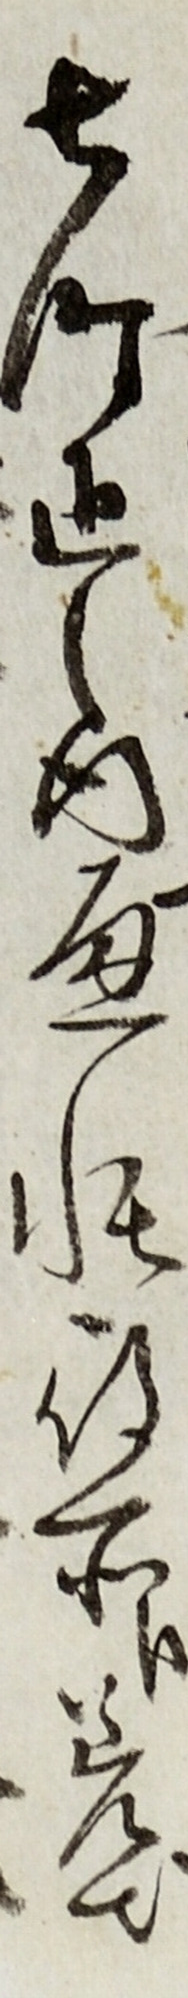七時迄之内通帳役所江差出
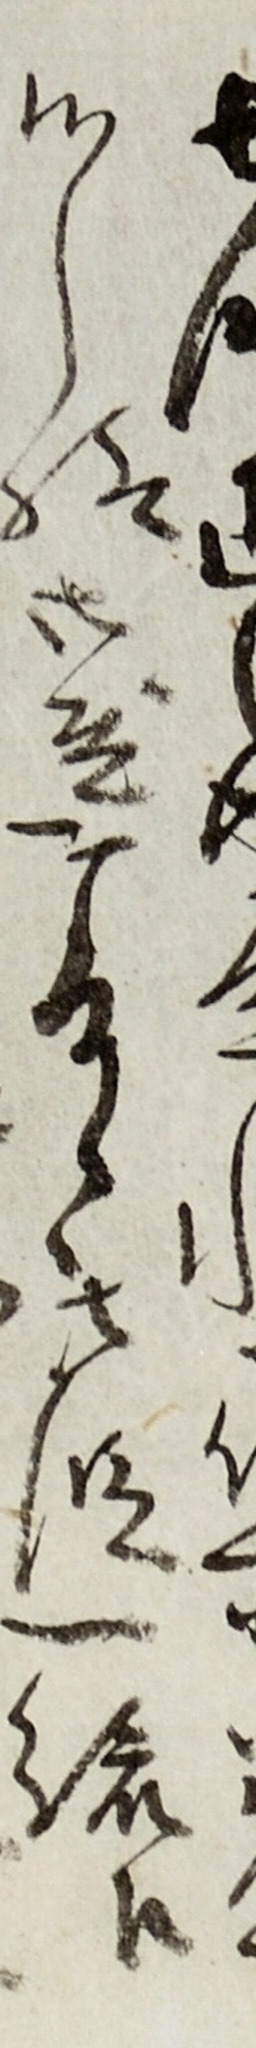候様仕度奉存候此段一統江
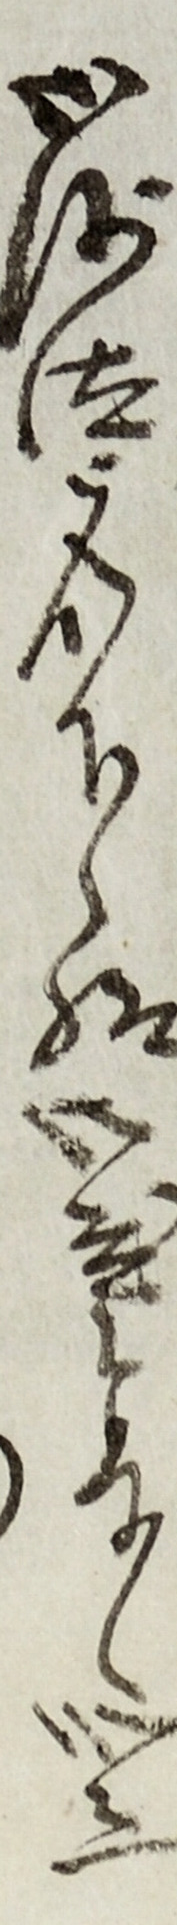御沙汰被成下候様仕度奉存候以上
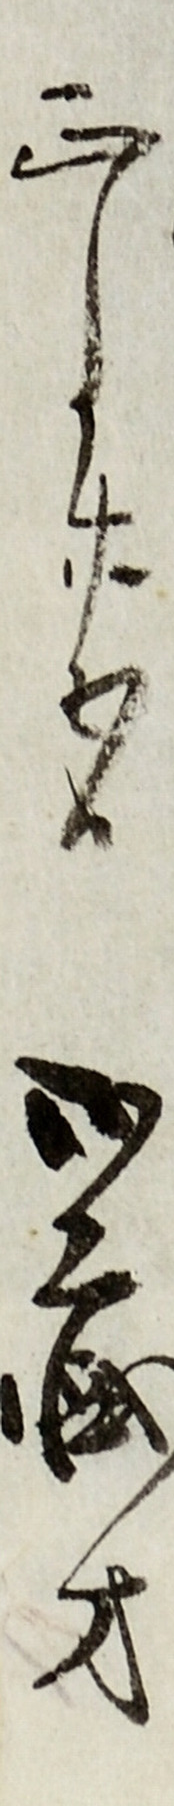正月廿五日御蔵方
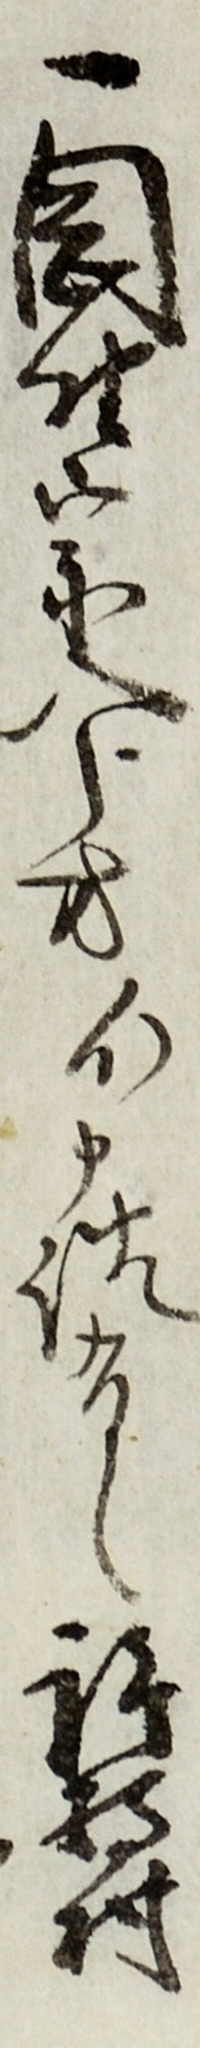一岡野宗八郎方ゟ申談有之鉾持村
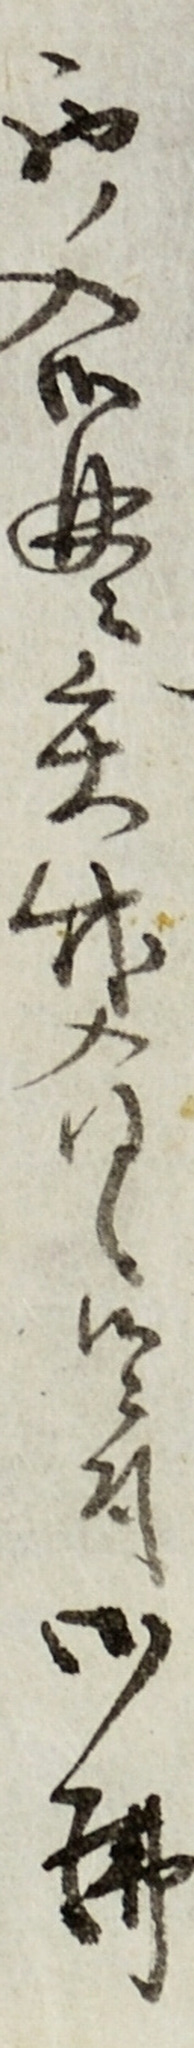西ノ入御林ニ矢竹有之候ニ付御払
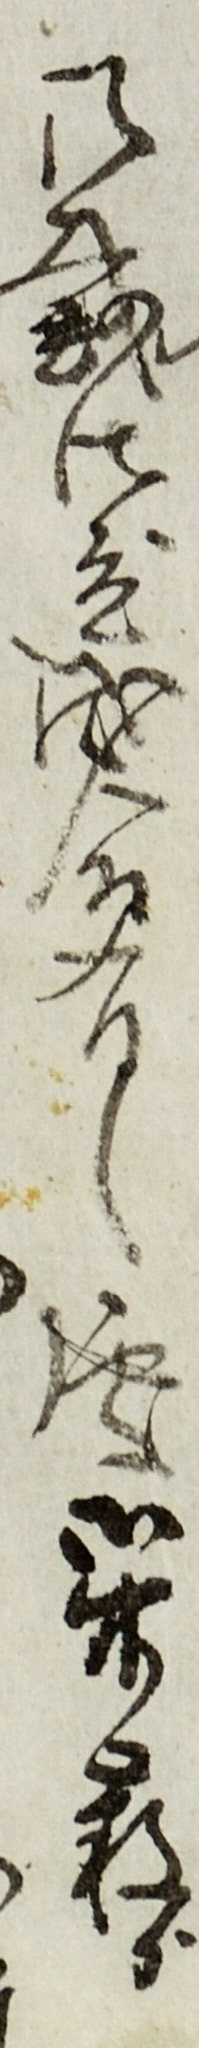頂戴仕度掛合有之処御竹薮ゟ
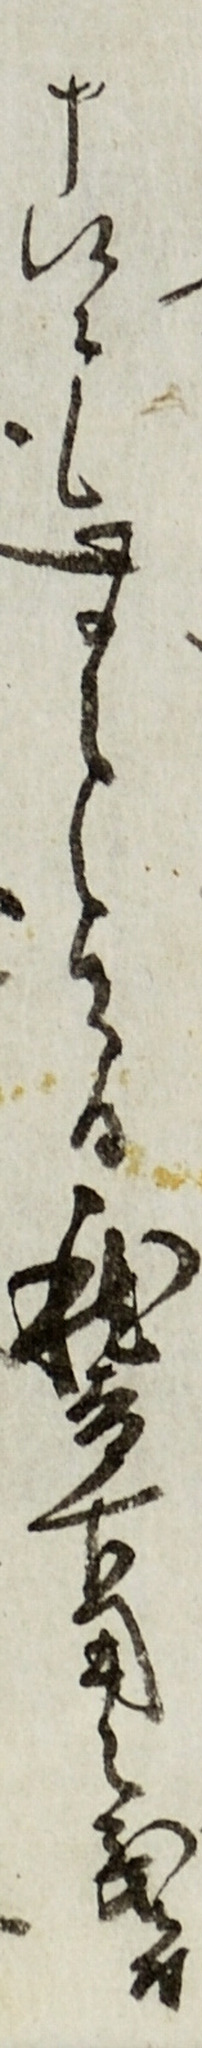申候ニも無之候間稽古用之義ニ付
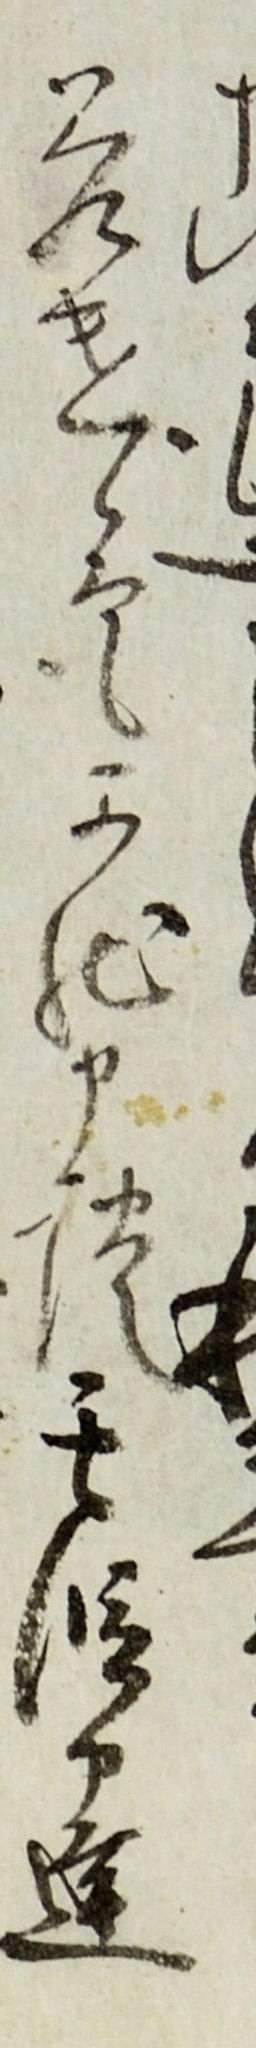差遣候而も可然申談其段申達
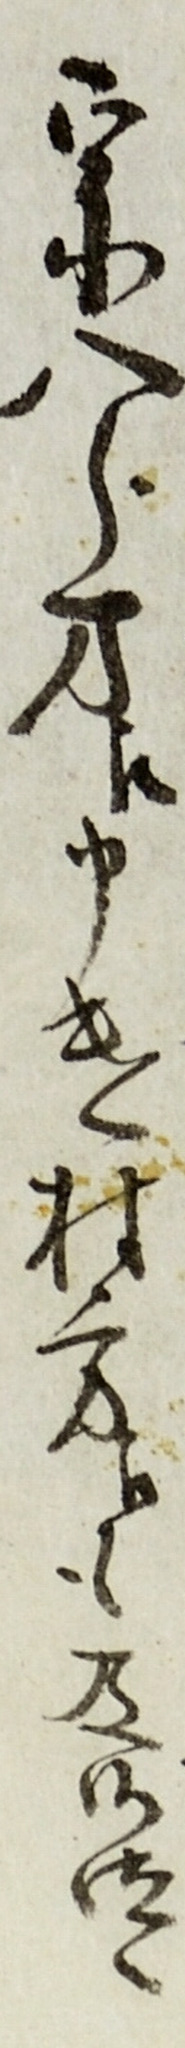宗八郎方江申遣村方江も及沙汰候
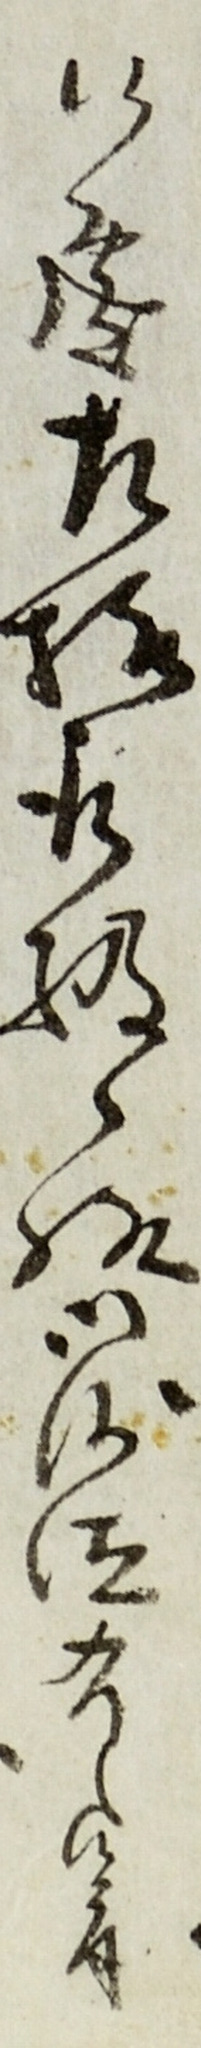候処左様取扱候様御沙汰有之候ニ付
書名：御山方御薪方諸事御用留
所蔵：伊那市立高遠町図書館・合同会社AMANE
